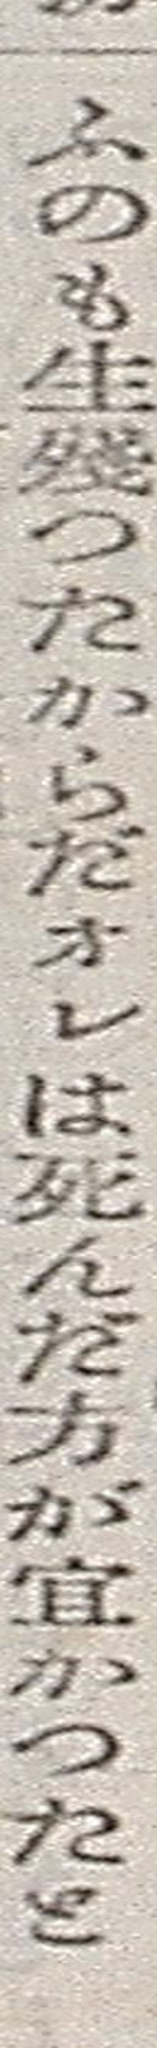ふのも生残つたからだオレは死んだ方が宜かつたと
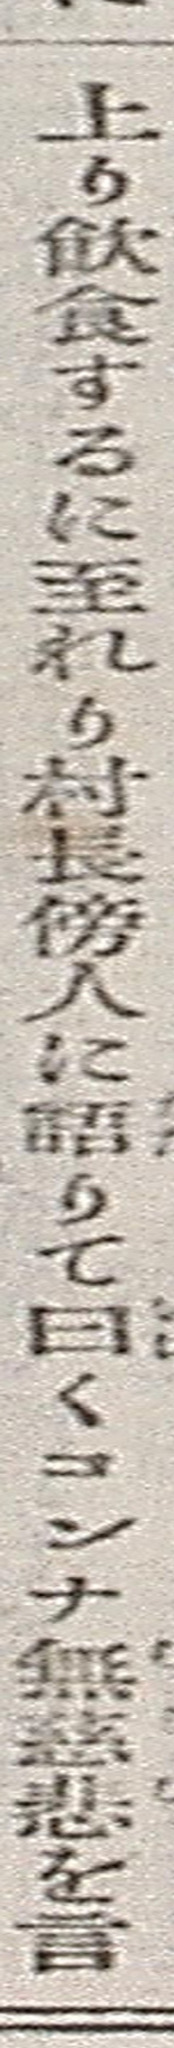上り飲食するに至れり村長傍人に語りて曰くコンナ無慈悲を言
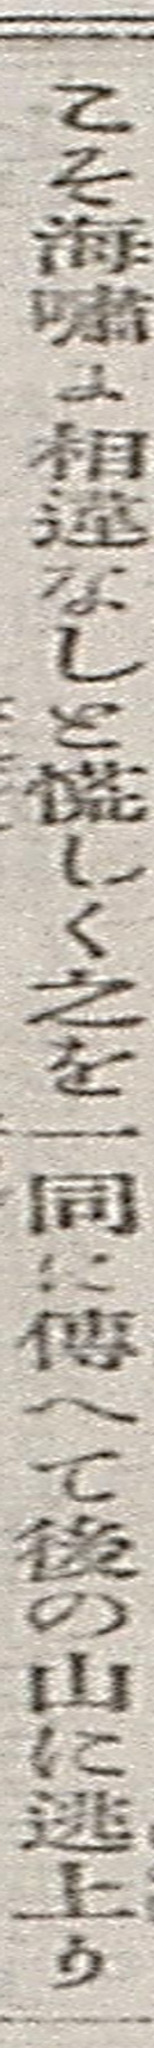こそ海嘯に相違なしと慌しく之を一同に伝へて後の山に逃上り
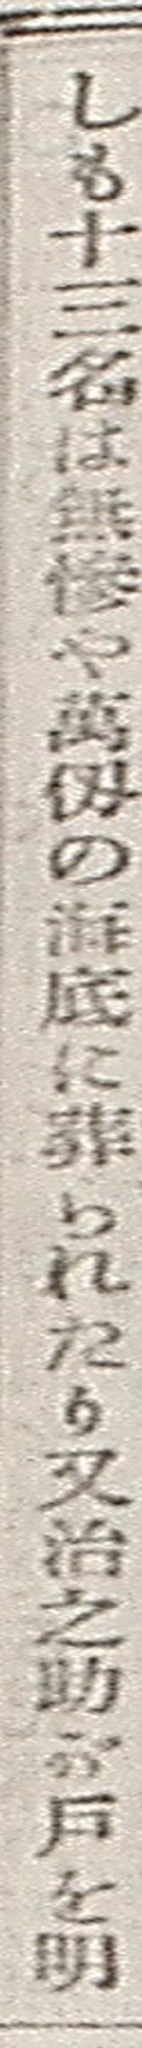しも十三名は無惨や万仭の海底に葬られたり又治之助が戸を明
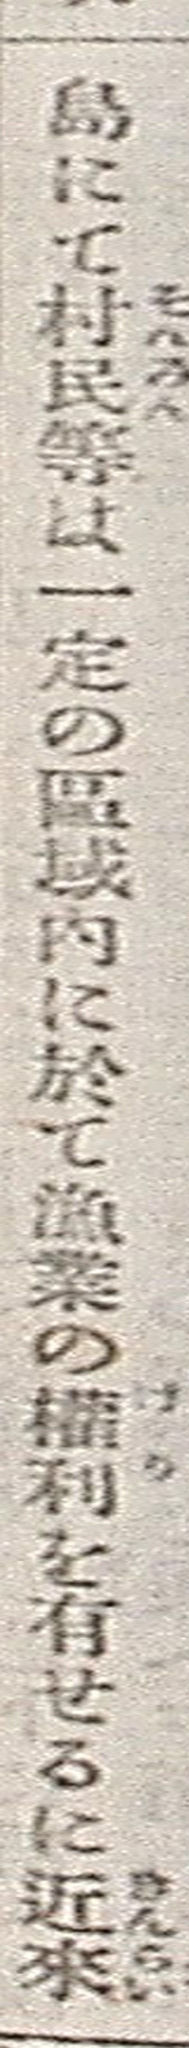島にて村民等は一定の区域内に於て漁業の権利を有せるに近来
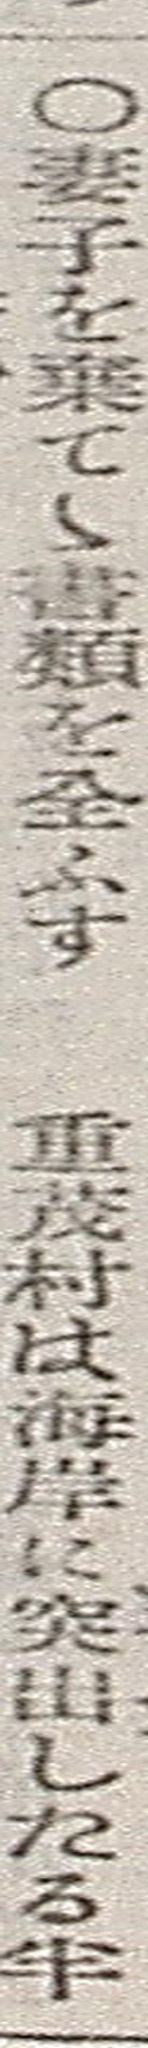○妻子を棄てゝ書類を全ふす重茂村は海岸に突出したる半

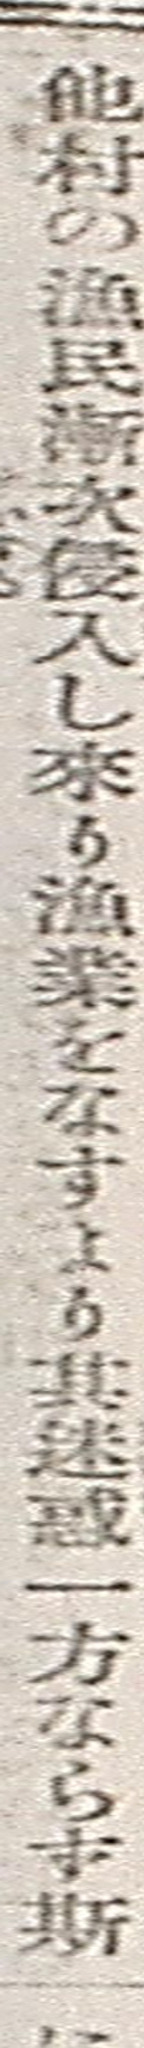他村の漁民漸次侵入し来り漁業をなすより其迷惑一方ならず斯
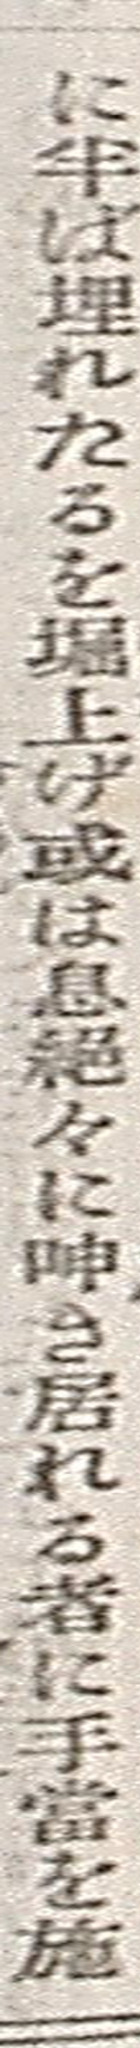に半ば埋れたるを堀上げ或は息絶々に呻き居れる者に手当を施
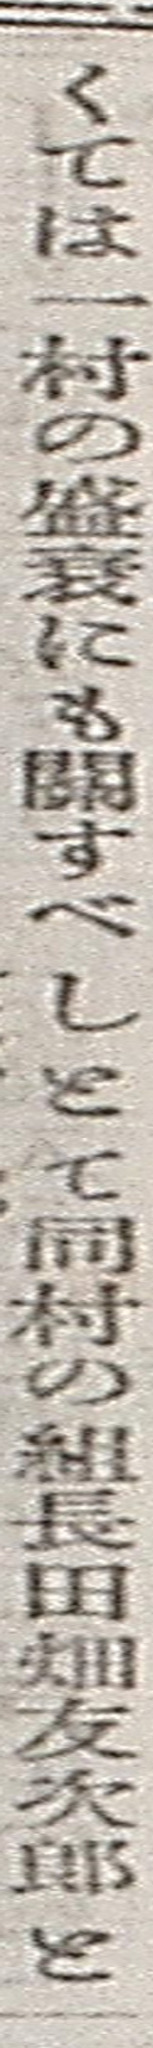くては一村の盛衰にも関すべしとて同村の組長田畑友次郎と
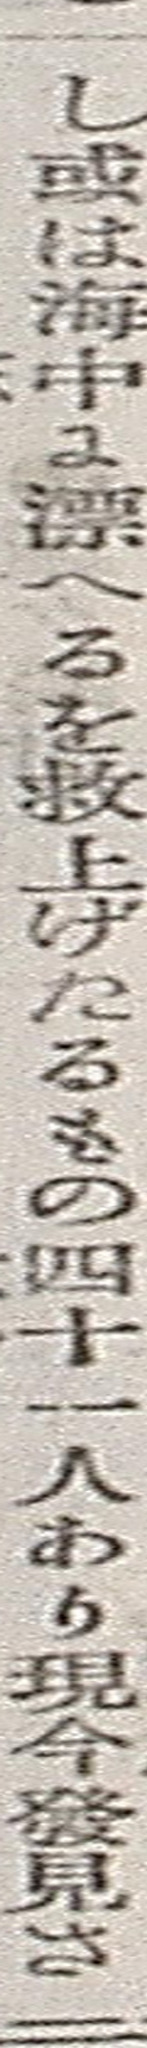し或は海中に漂へるを救上げたるもの四十一人あり現今発見さ
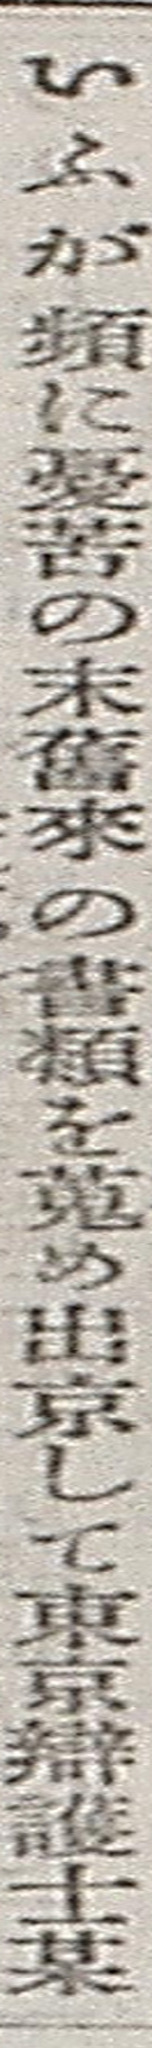いふが頻に憂苦の末旧来の書類を蒐め出京して東京弁護士某
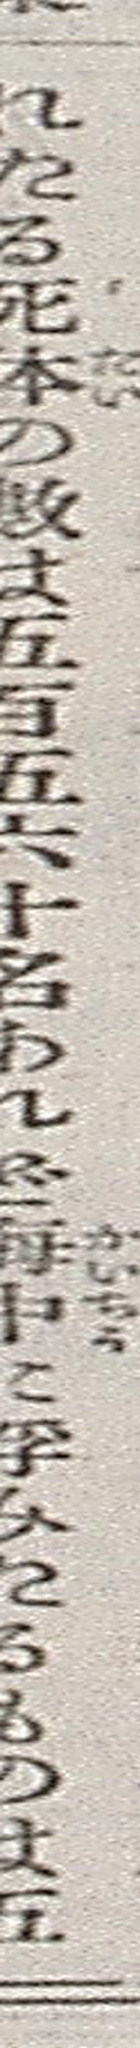れたる死体の数は五百五六十名あれど海中に浮みたるものは五
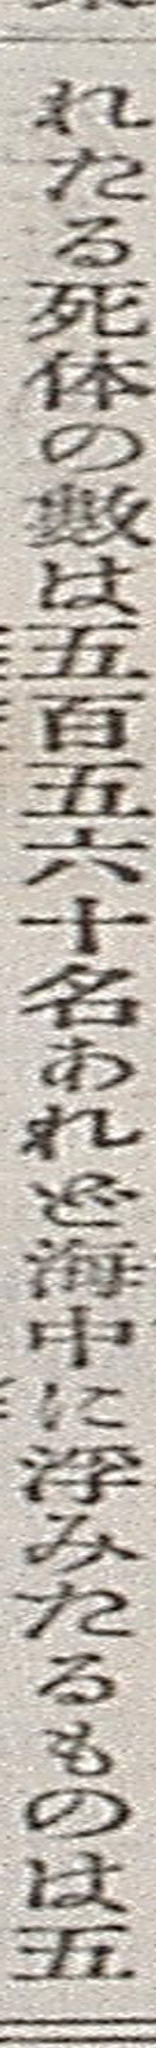れたる死体の数は五百五六十名あれど海中に浮みたるものは五
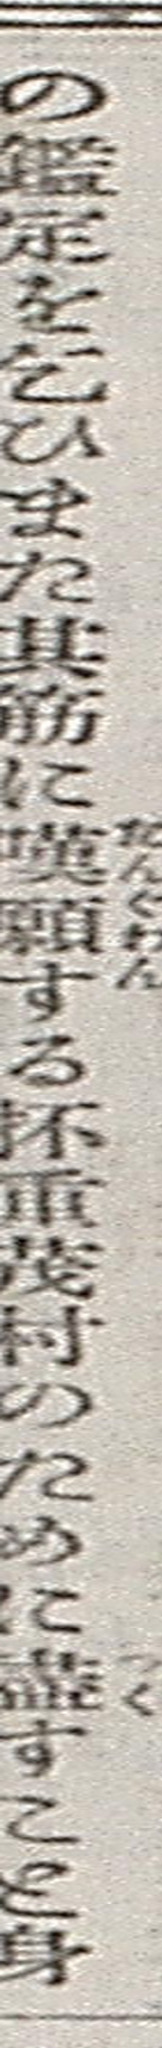の鑑定を乞ひまた其筋に嘆願する抔重茂村のために尽すこと身
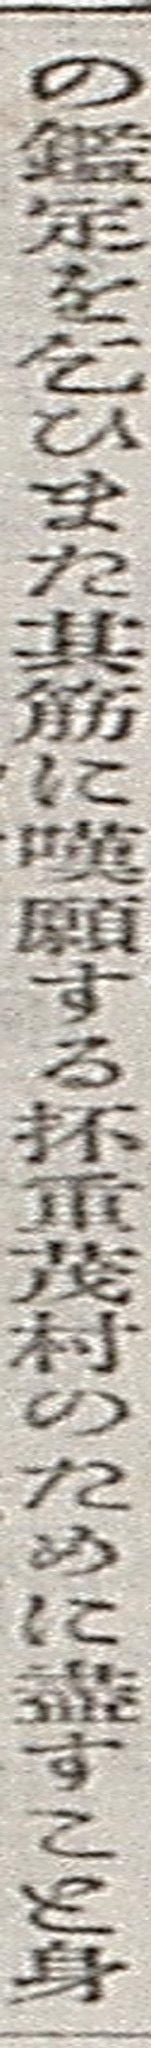の鑑定を乞ひまた其筋に嘆願する抔重茂村のために尽すこと身
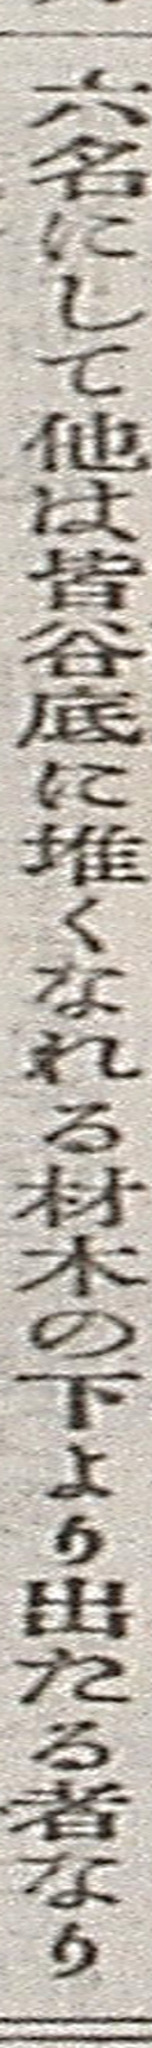六名にして他は皆谷底に堆くなれる材木の下より出たる者なり
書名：風俗畫報臨時増刊第百二十號　大海嘯被害録（下）
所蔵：東京大学地震研究所図書室 Earthquake Research Institute Library, The University of Tokyo, JAPAN
